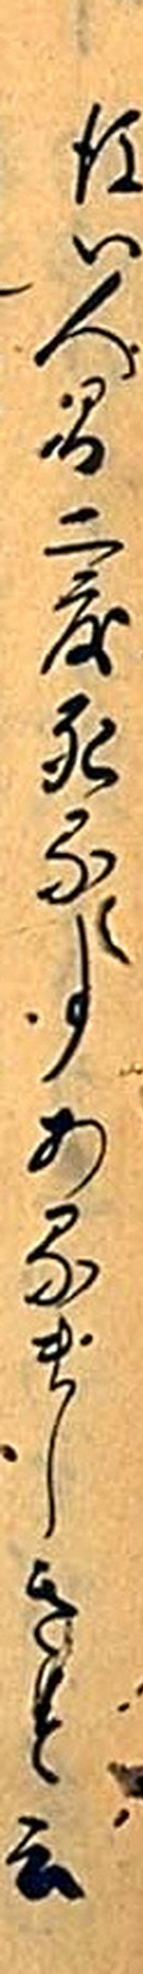後は人間二度死る事あるましきと云
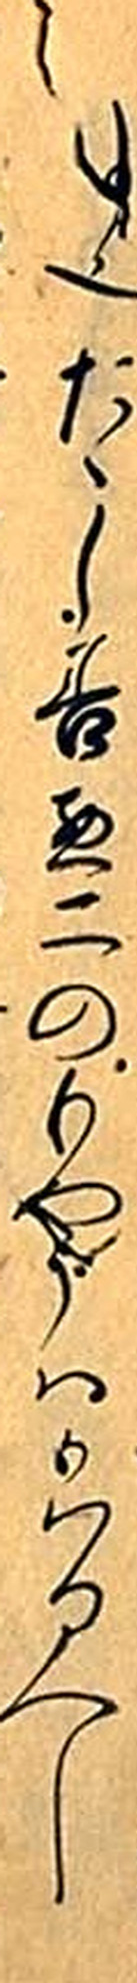事也たゝし善悪二のもやうはかはるへし
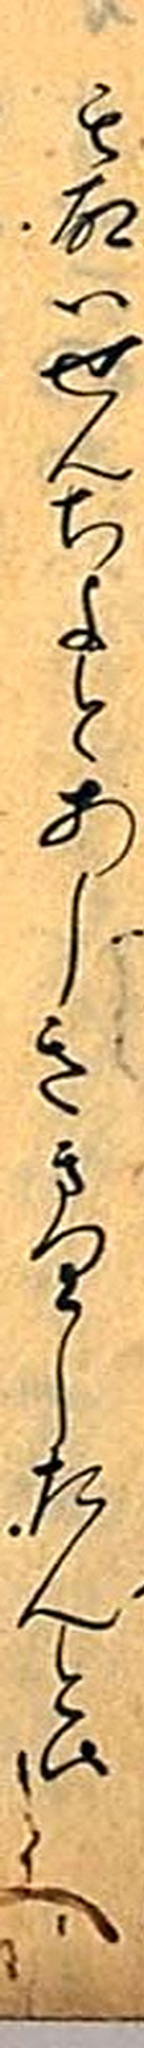其故はせんちよとあしききりしたんとは
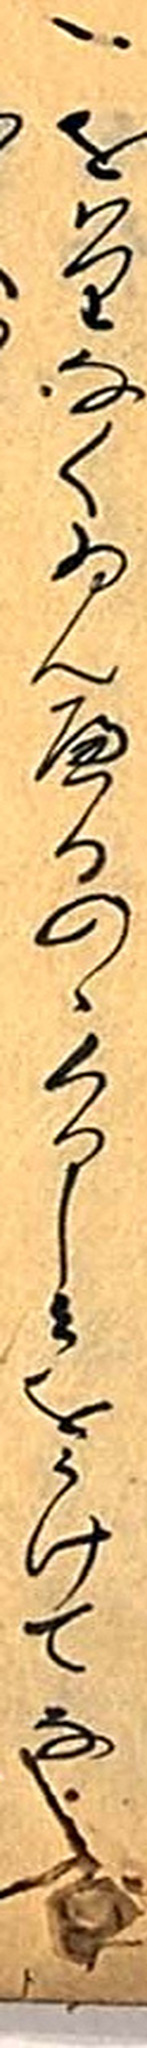をはりなくゐんへるのゝくるしみをうけてな
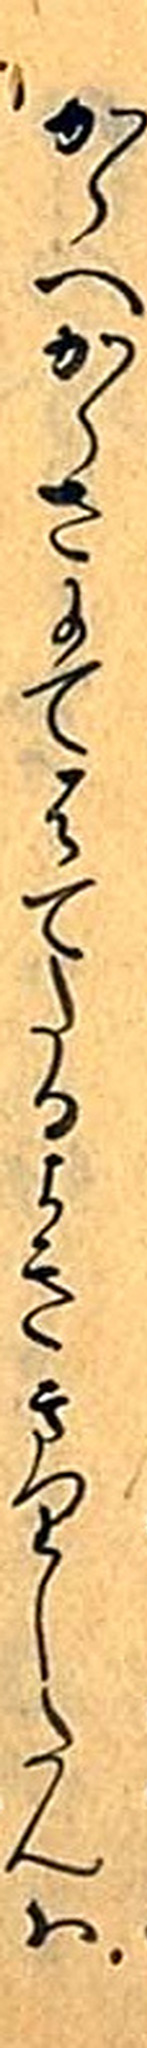からへからさにてはてたるよききりしたんは
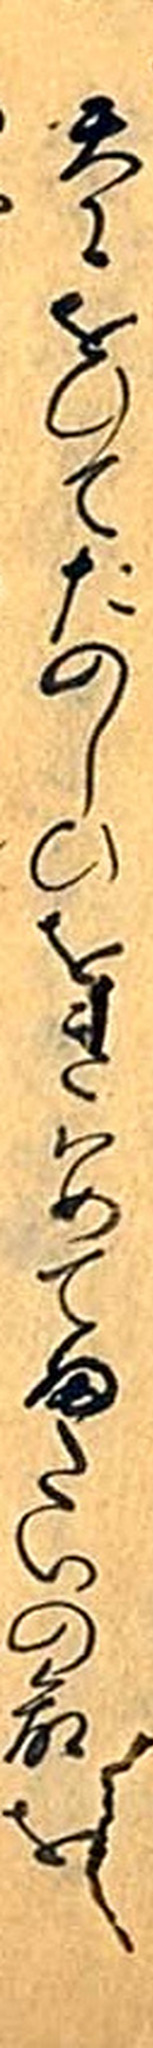天にをひてたのしひをきはめてふたいの命を
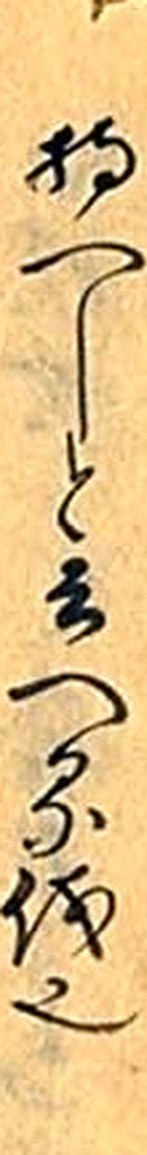持へしと云へる儀也
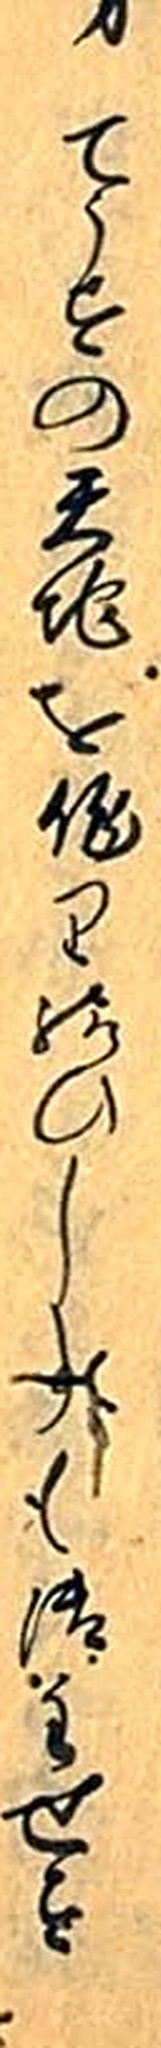弟てうすの天地を作り給ひし事も御主せす
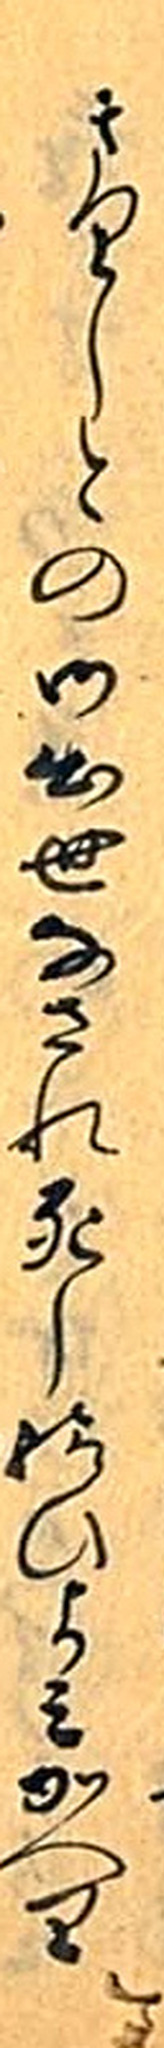きりしとの御出世なされ死し給ひよみかえり
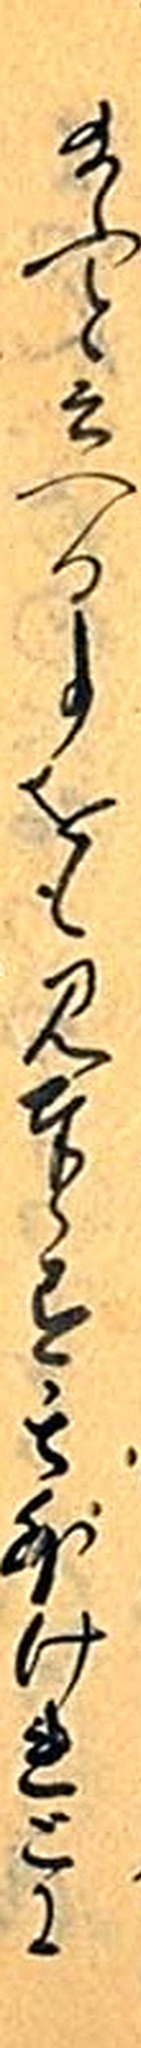給ふと云へる事をも見奉らす其外けれとに
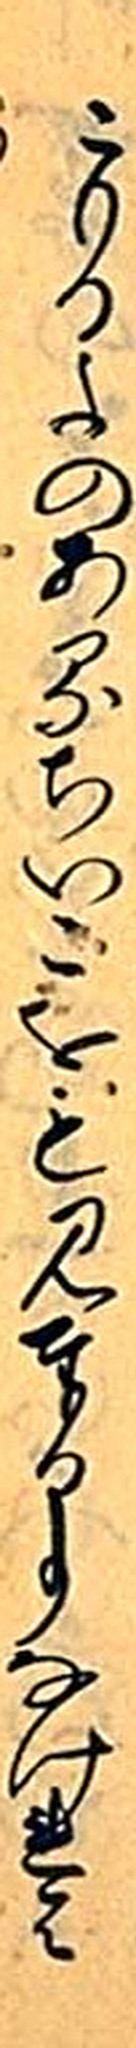こもるよのあるちいこをも見奉る事なけれは
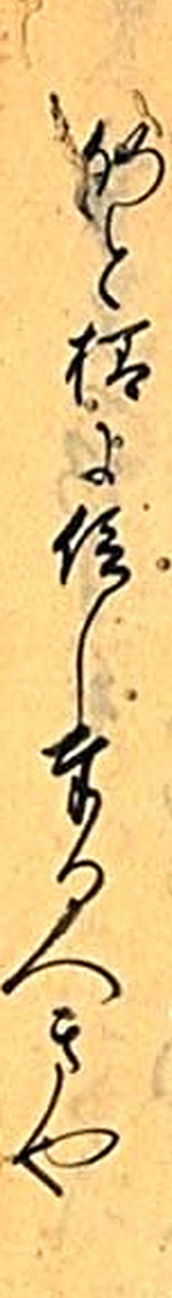何と様に信し奉るへきや
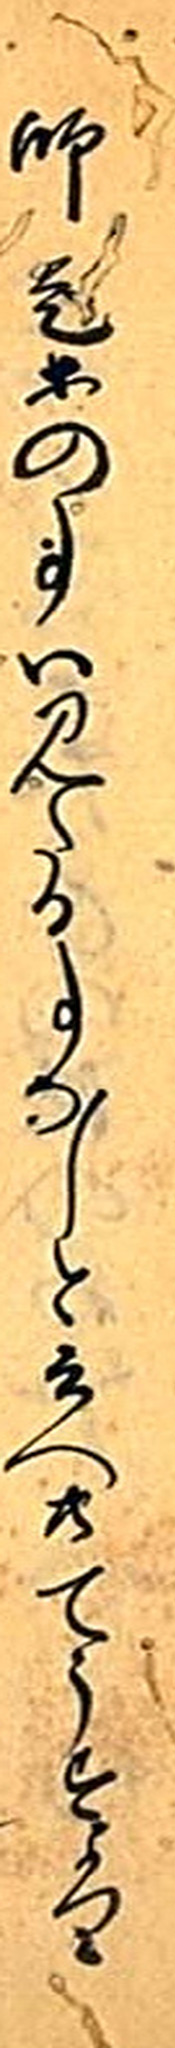師是等の事は見たる事となしと云へ共てうすより
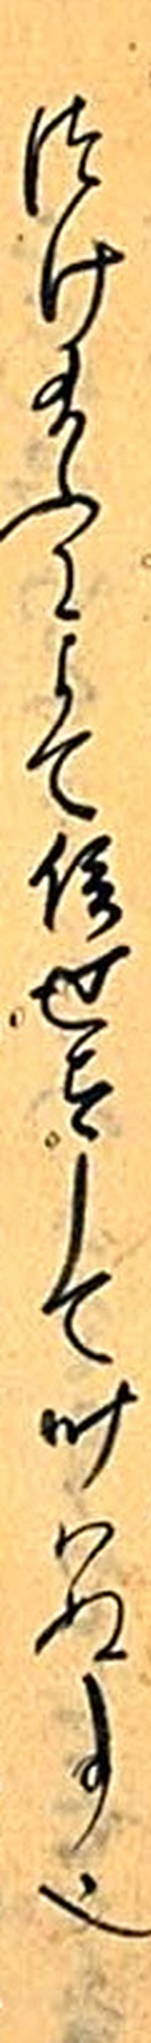つけ給ふによて信せすして叶はぬ事也
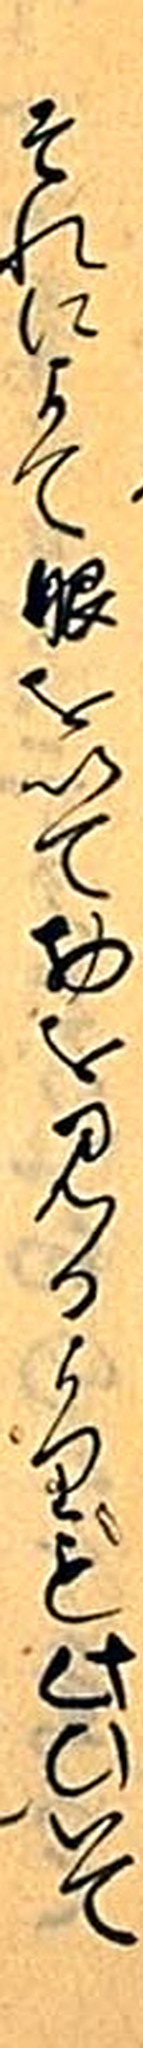それによて眼を以て物を見るよりも此ひいて
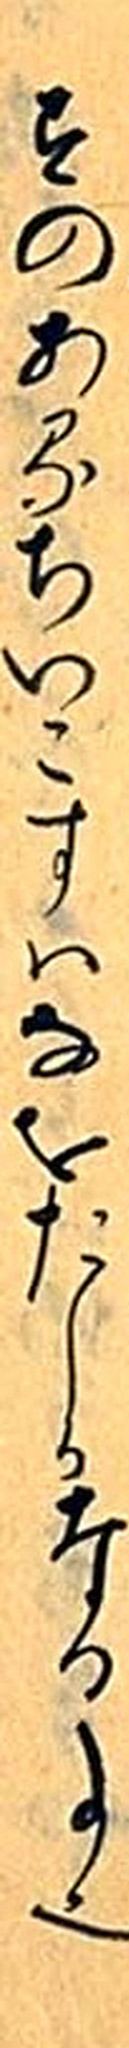すのあるちいこすはなをたしかなる事也
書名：ドチリナ・キリシタン
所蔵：東京大学総合図書館 / General Library in the University of Tokyo
